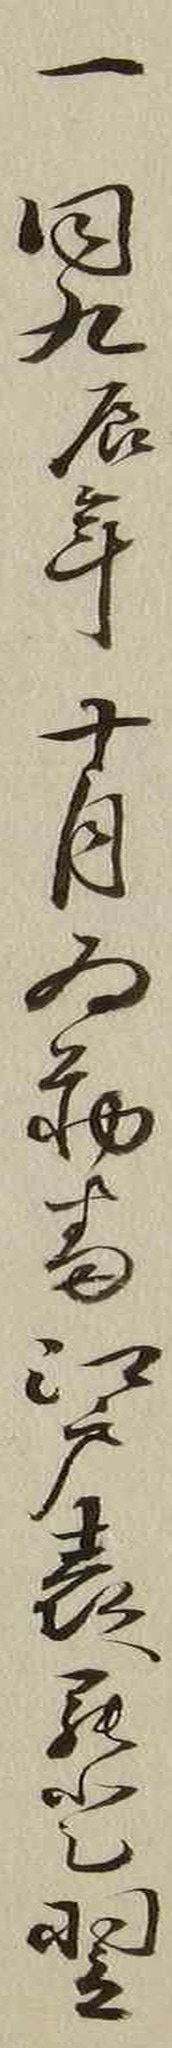一同九辰年十月為勤番江戸表へ罷登翌
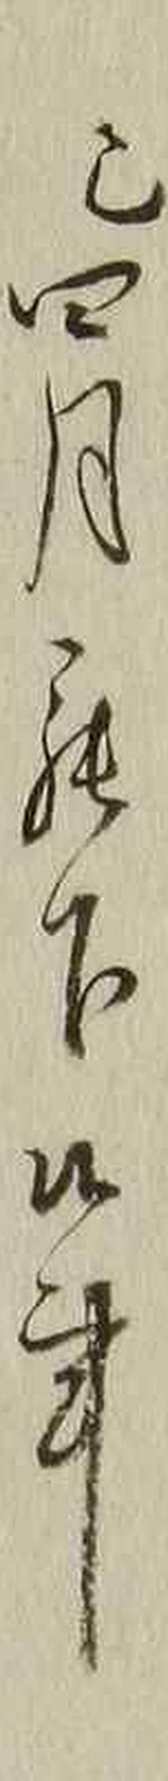巳四月罷下候事
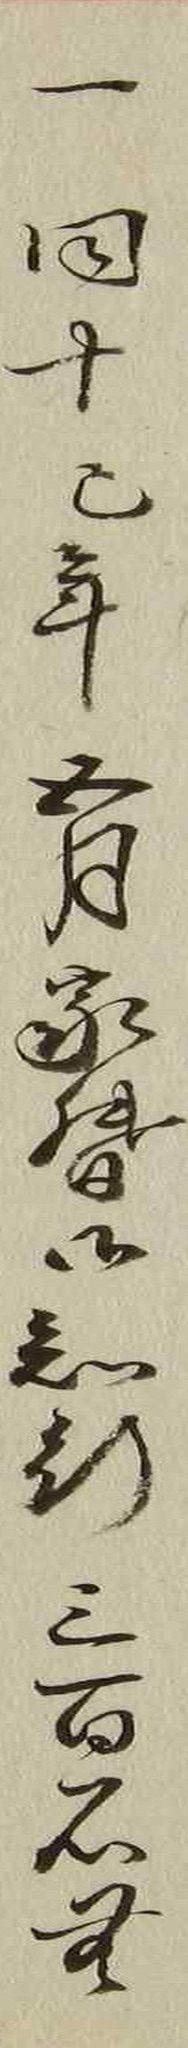一同十巳年五月家督御知行三百石無
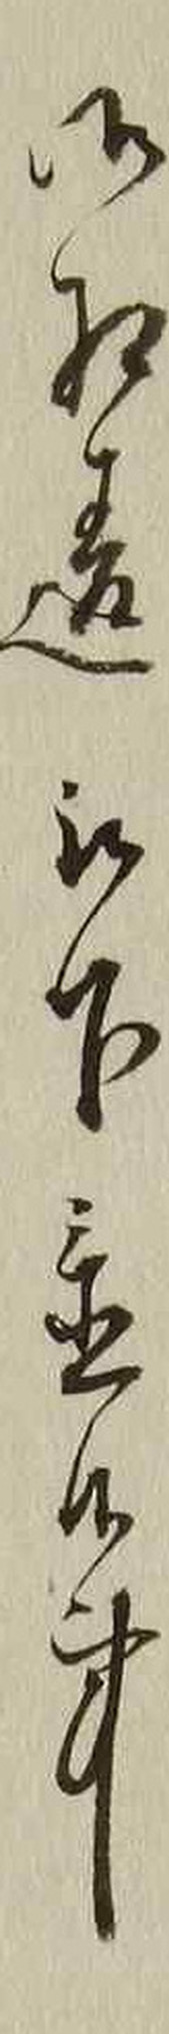御相違被下置候事
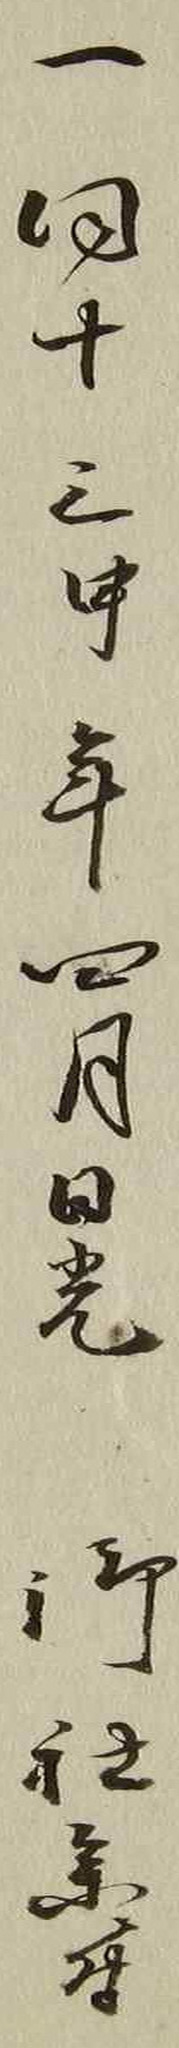一同十三申年四月日光御社参ニ付
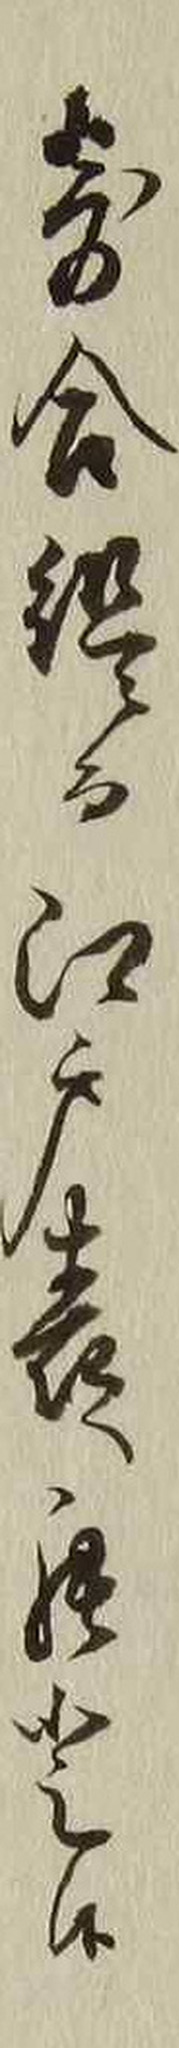寄合組ニ而江戸表へ罷登候
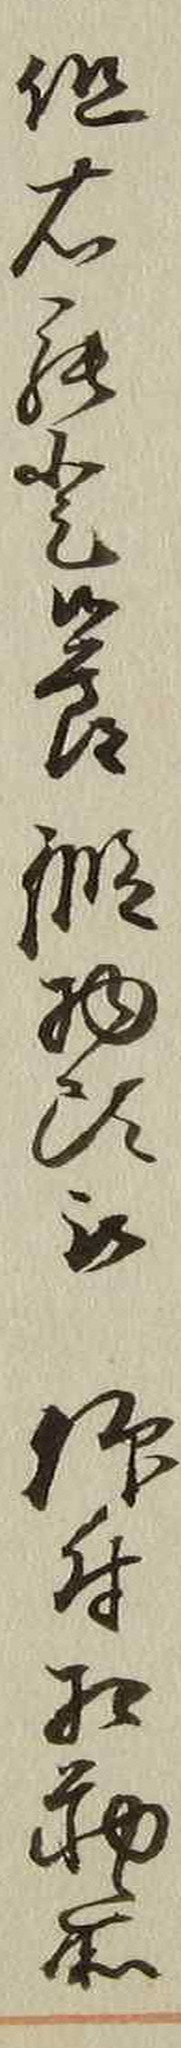但右罷登候節仮物頭被仰付相勤候所
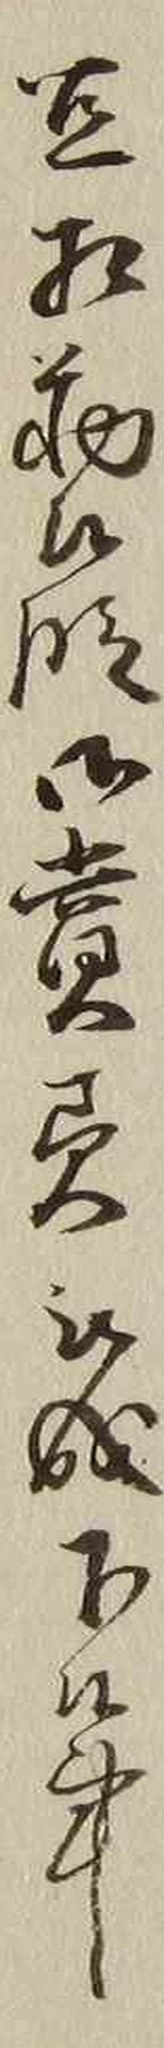宜相勤候段御賞美被成下候事
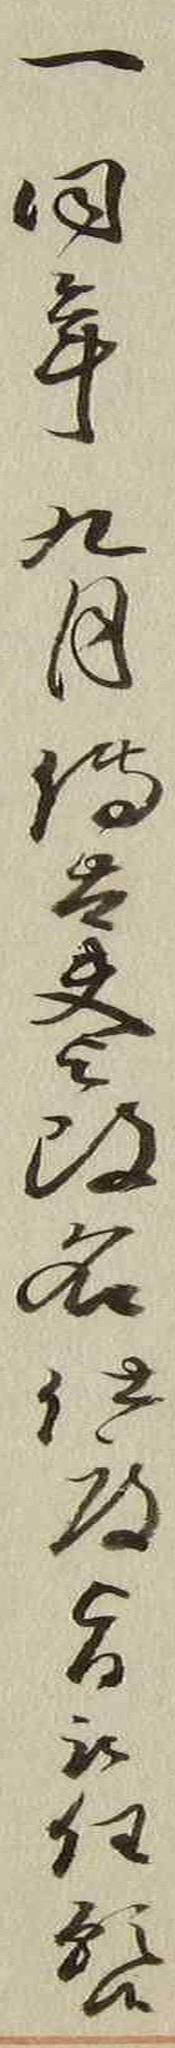一同年九月伝太夫与改名仕度旨被任願候
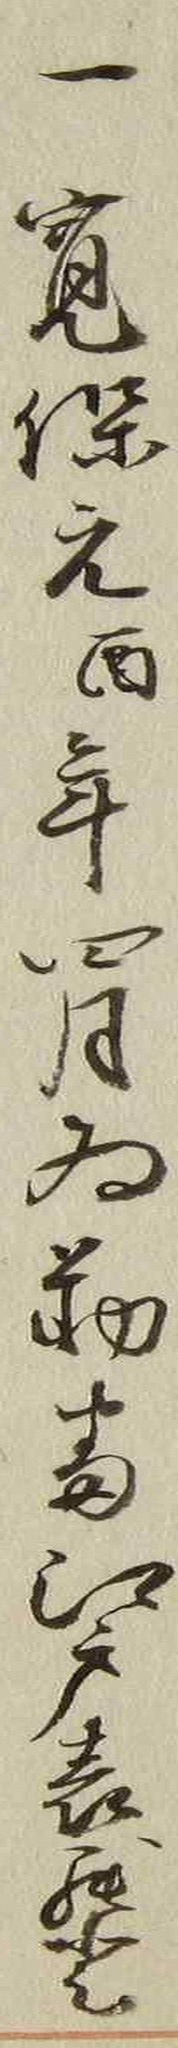一寛保元酉年四月為勤番江戸表へ罷登
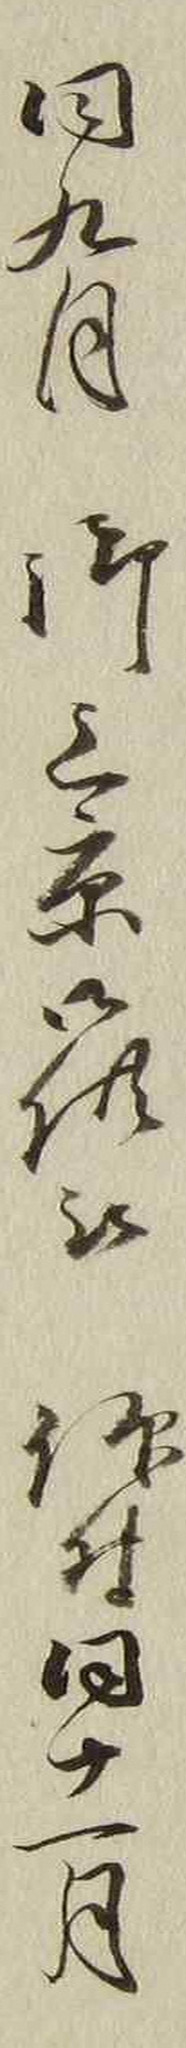同九月御上京御供被仰付同十一月
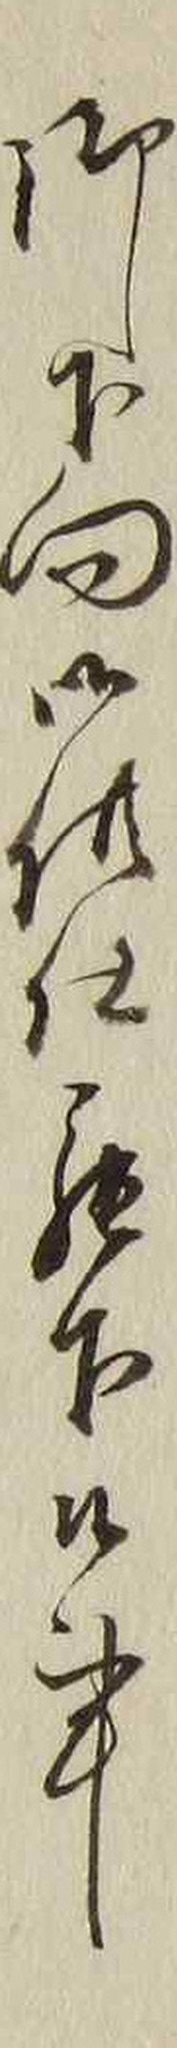御下向御供仕罷下候事
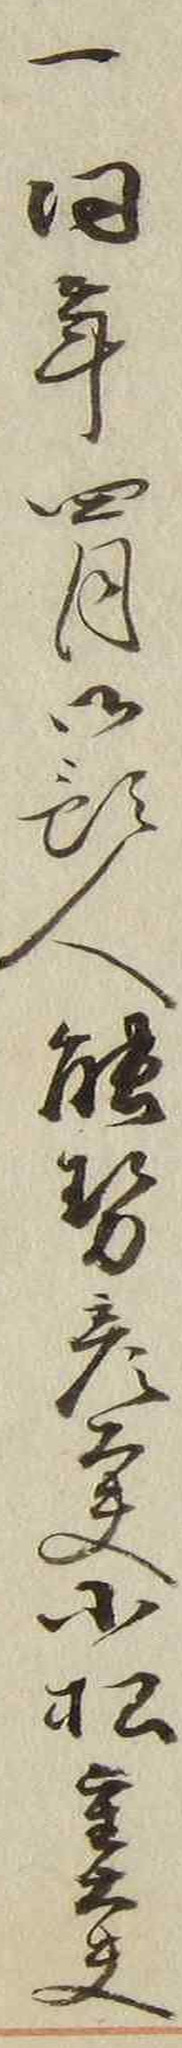一同年四月御預人能勢彦大夫小松重大夫
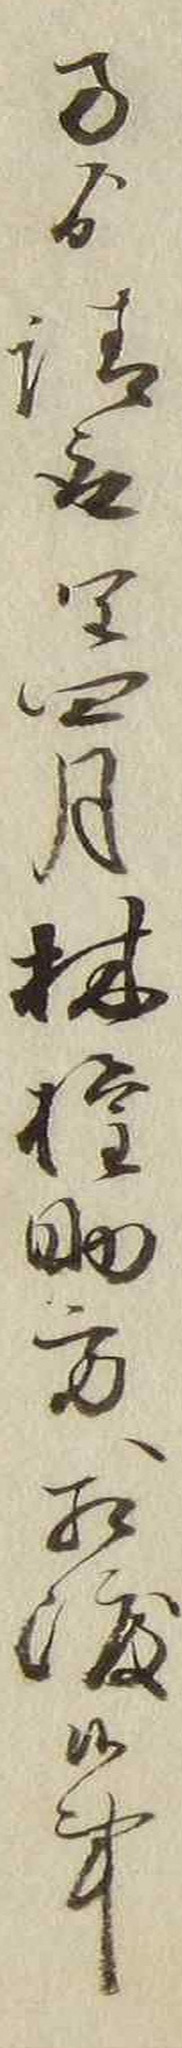方ゟ請取閏四月林権助方へ相渡候事

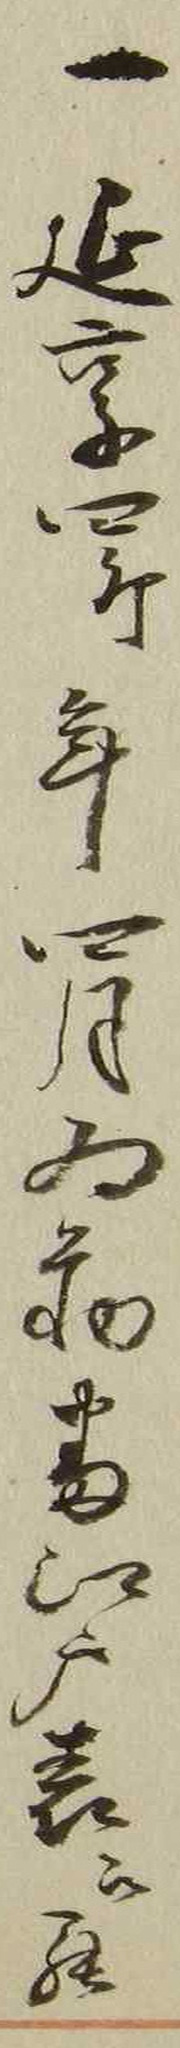一延享四卯年四月為勤番江戸表江罷
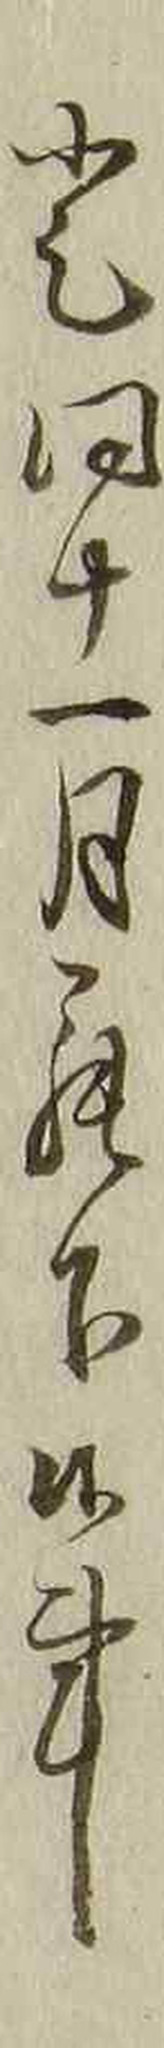登同十一月罷下候事
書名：諸士系譜　巻之122　よ之部5
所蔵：会津若松市立会津図書館
